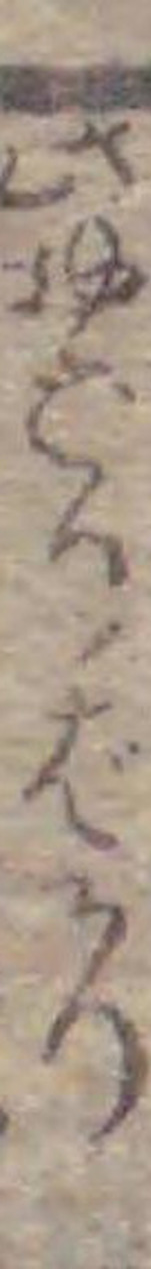此おごりばかり
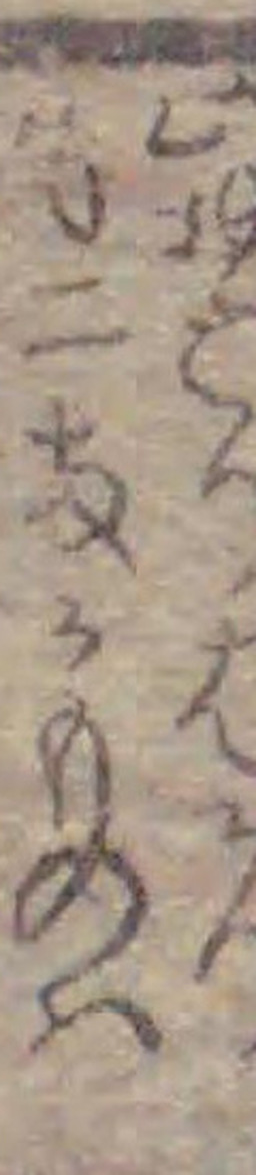も二両かものは

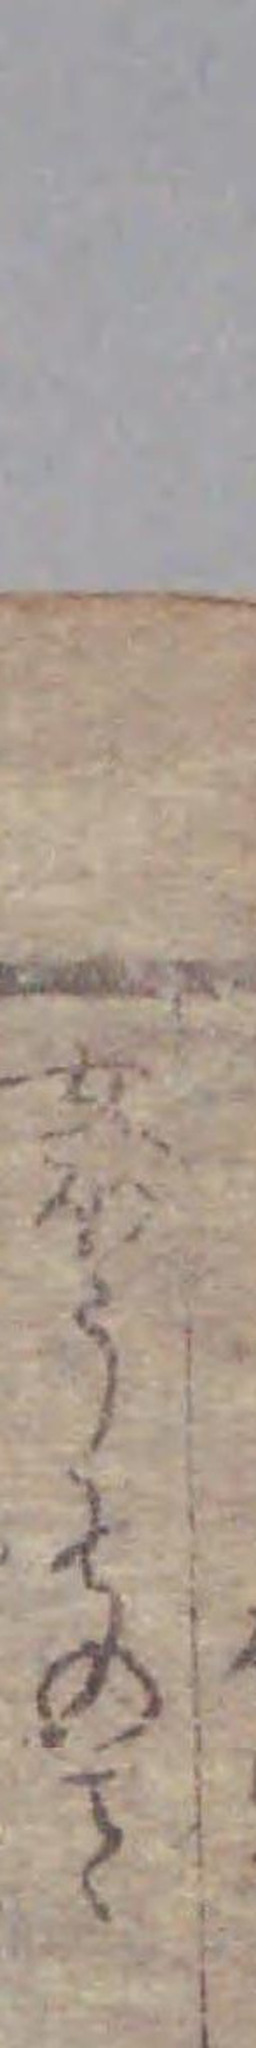女ほうそのこと
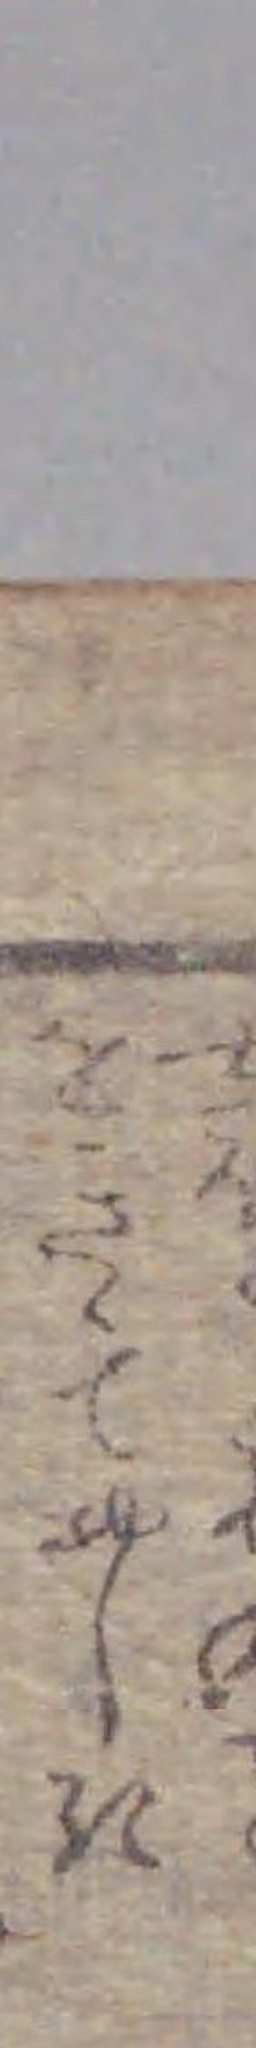をきゝておしき
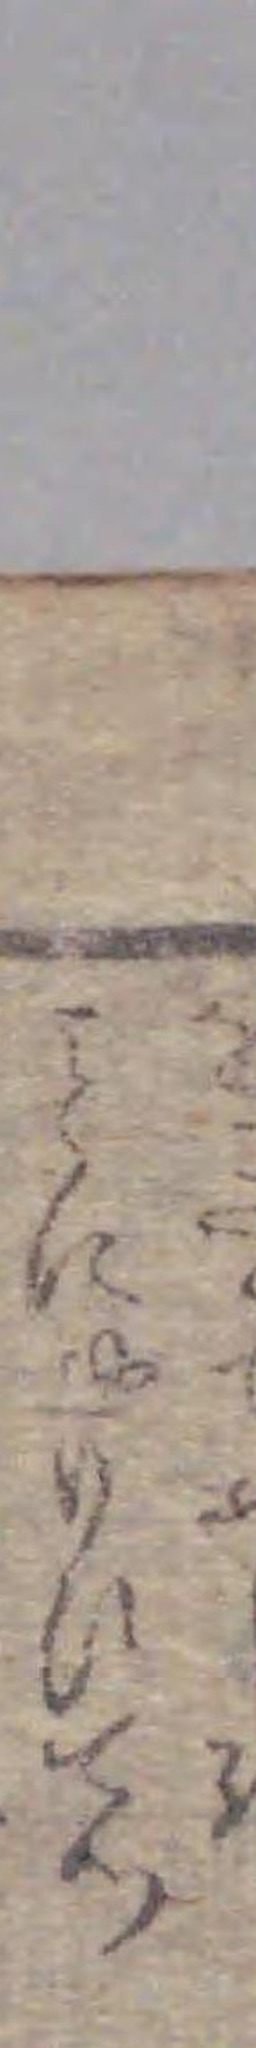ことにおもひてつ
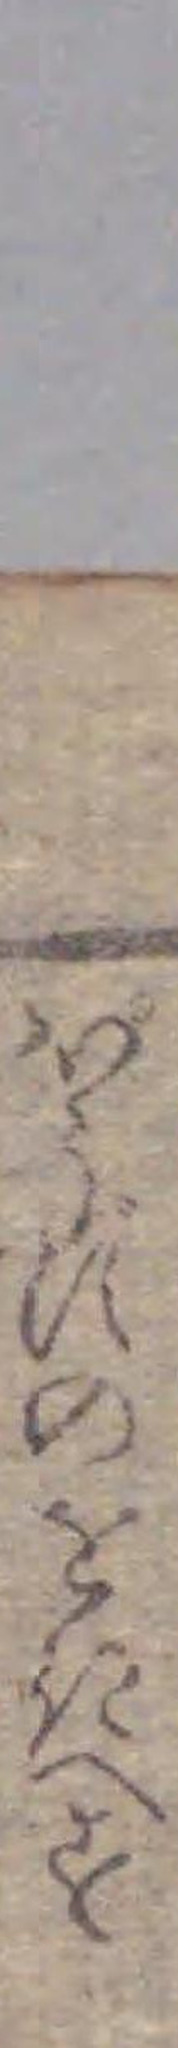ぽうずのをきへす
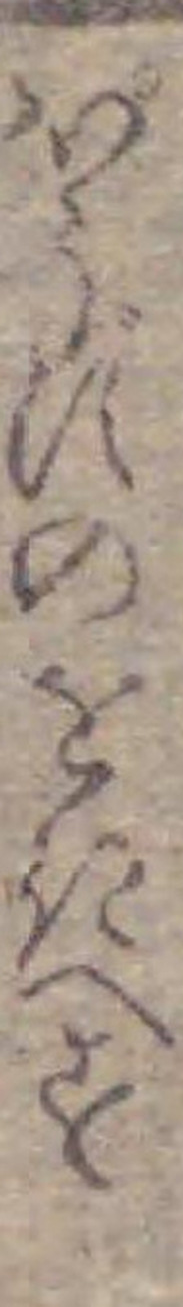ぽうずのをきへす
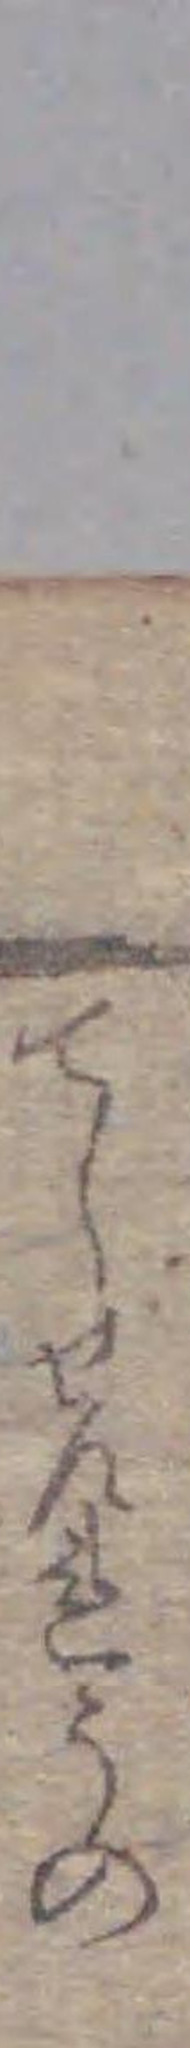てしせんれうの
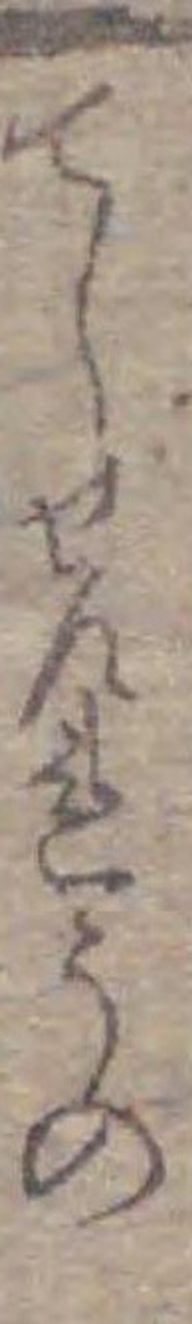てしせんれうの
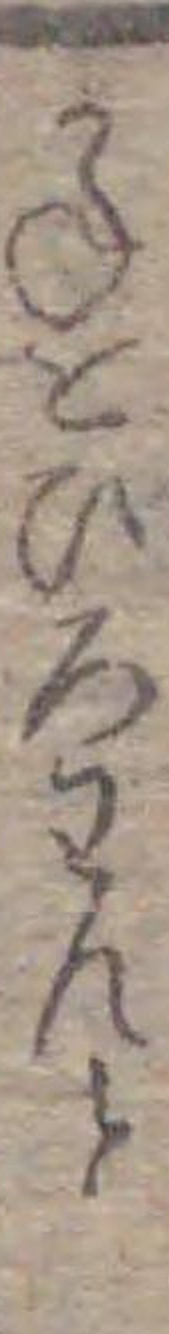かねをひろわんと
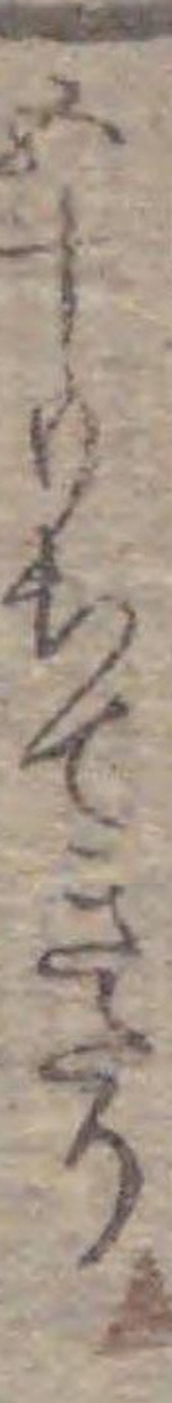五十もちてきたり
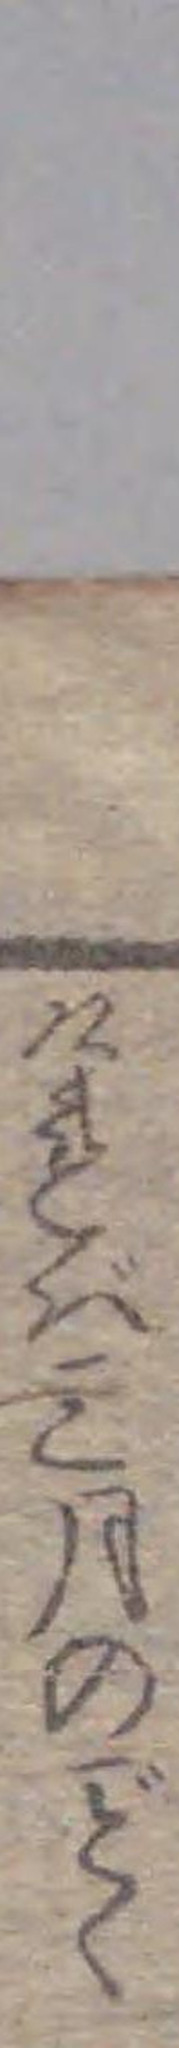ければ三月のごとく
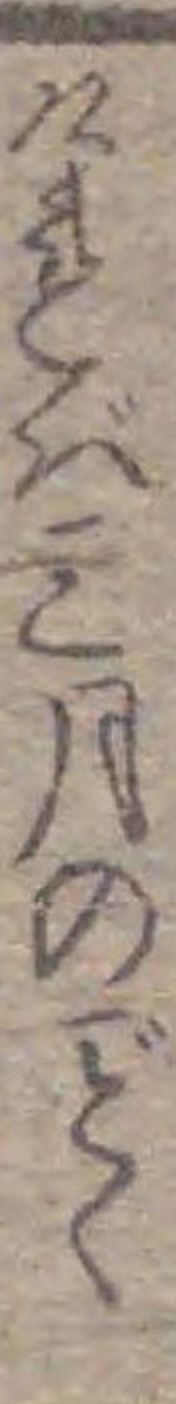ければ三月のごとく
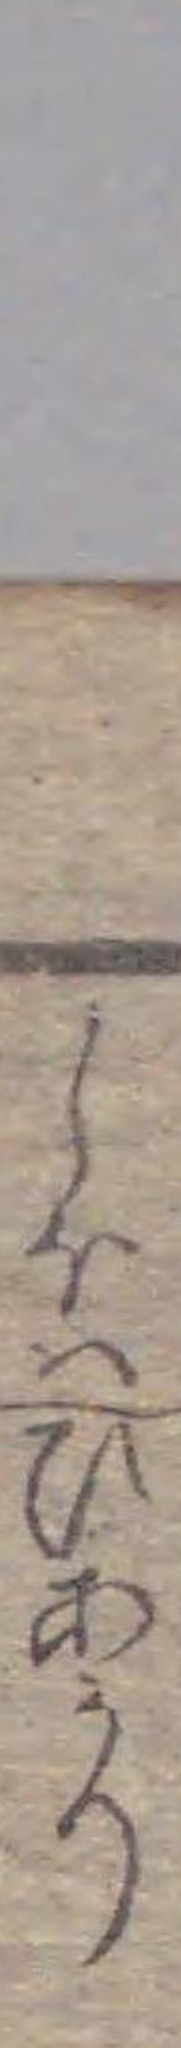しほはひあかり
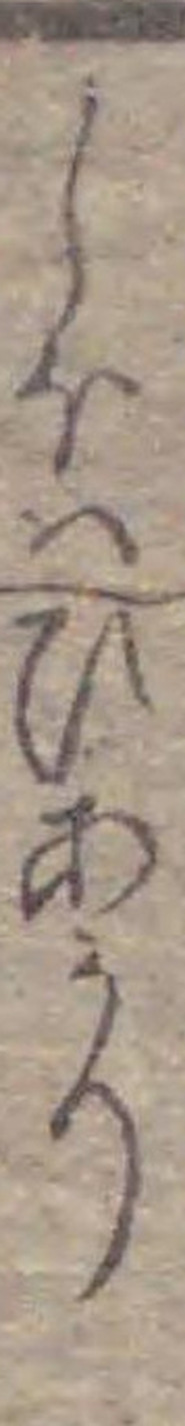しほはひあかり
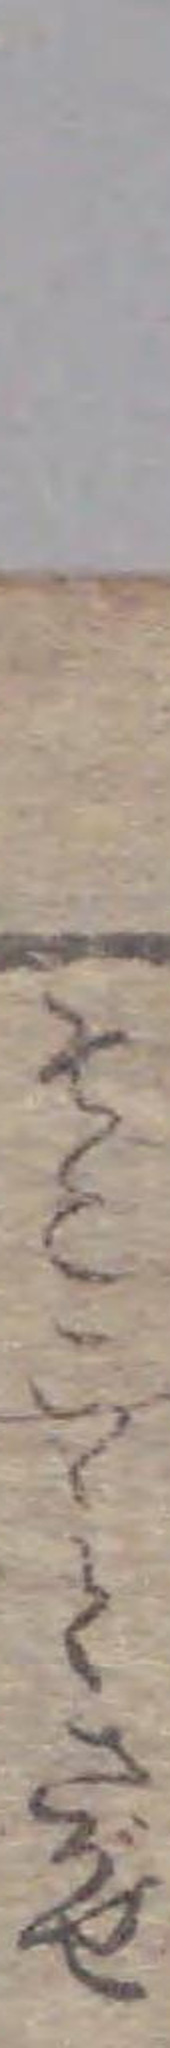そここゝとさがせ
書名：紺屋百物語 : 3巻
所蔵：国立国会図書館 National Diet Library, JAPAN
